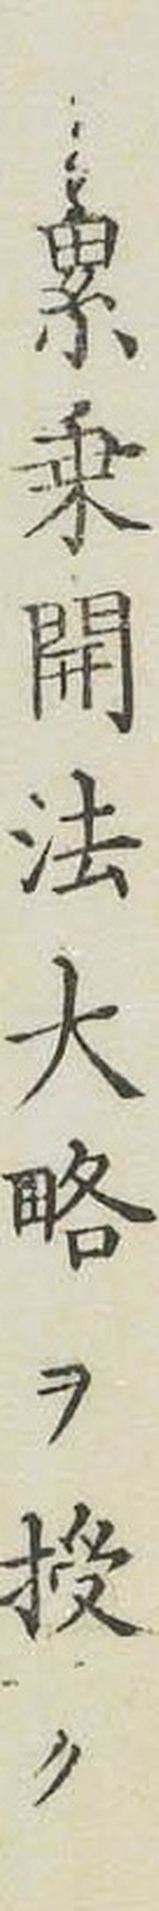累乗開法大略ヲ授ク
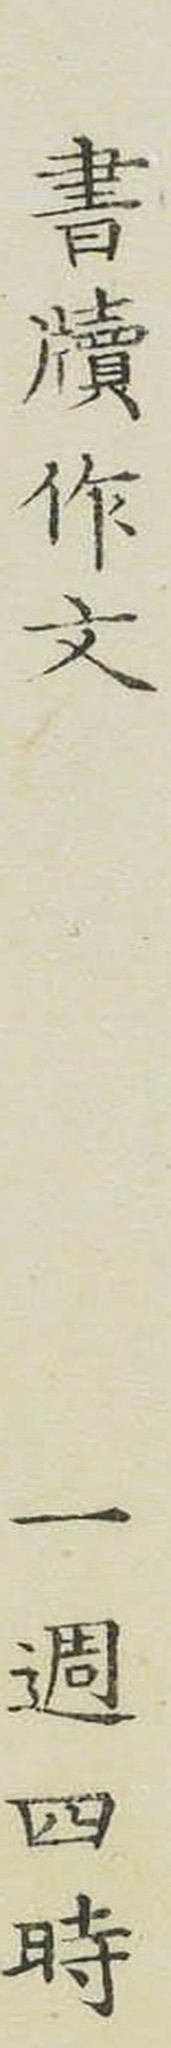書牘作文一週四時
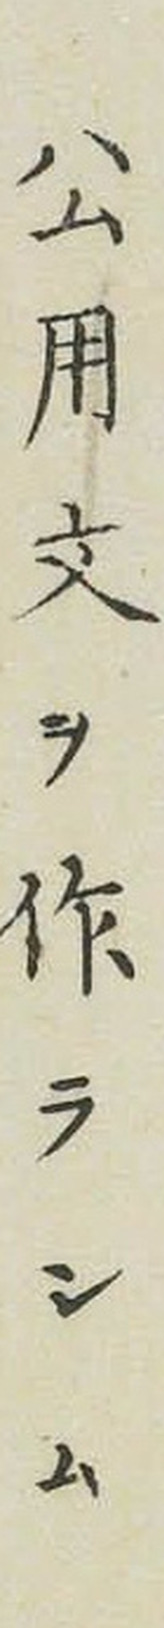公用文ヲ作ラシム
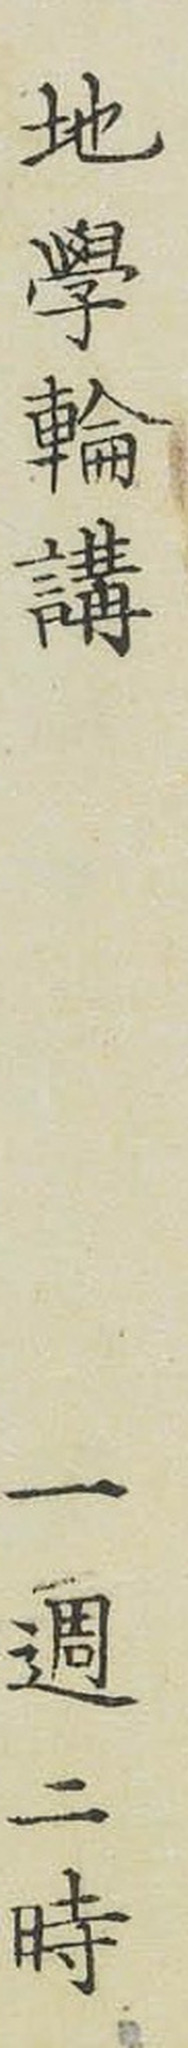地学輪講一週二時

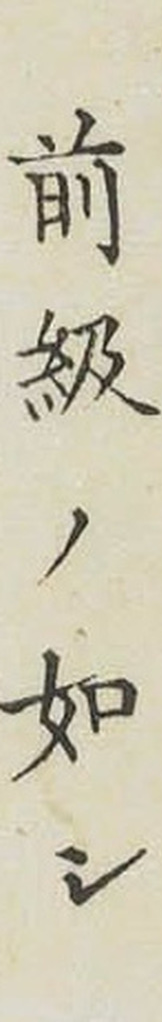前級ノ如シ
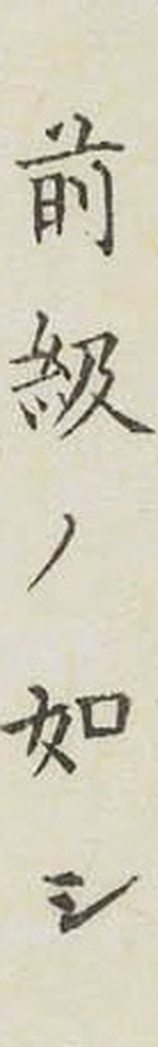前級ノ如シ
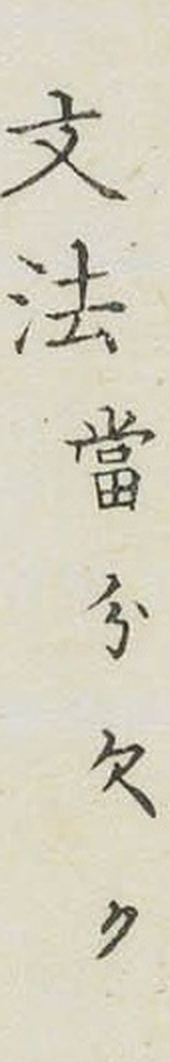文法当分欠ク
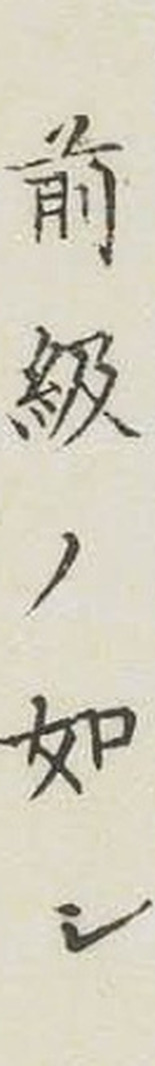前級ノ如シ
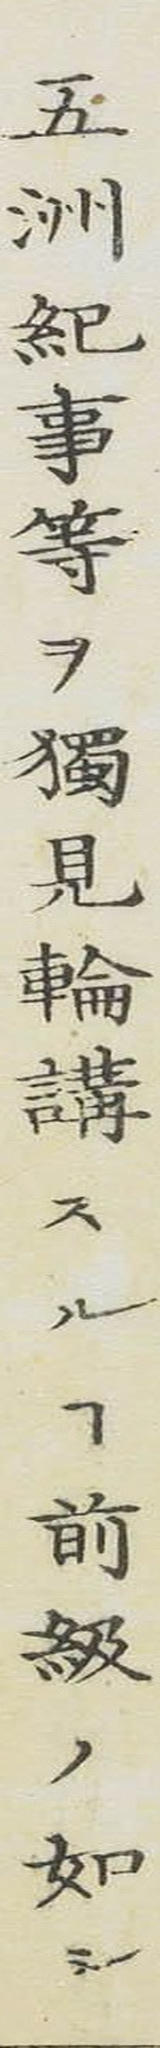五洲紀事等ヲ独見輪講スル事前級ノ如シ
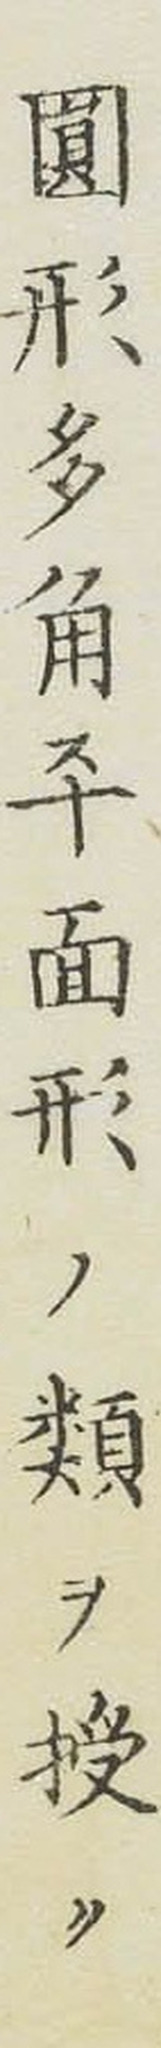円形多角平面形ノ類ヲ授ク
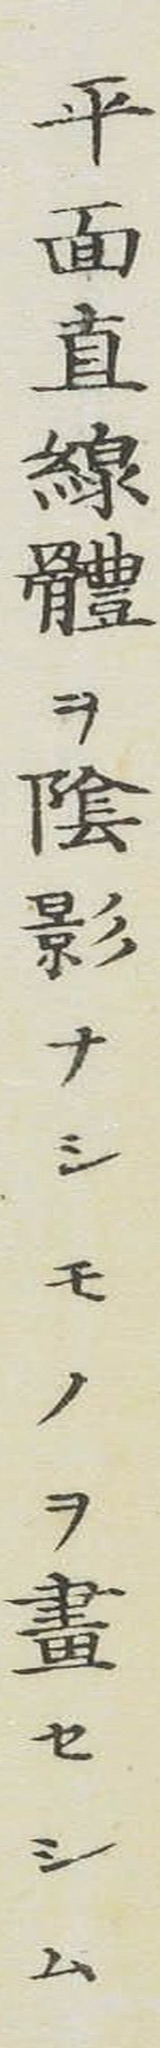平面直線体ヲ陰影ナシモノヲ書セシム
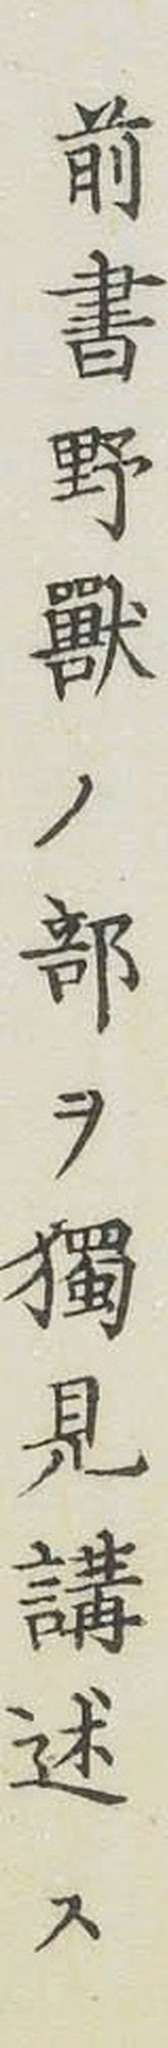前書野獣ノ部ヲ独見講述ス
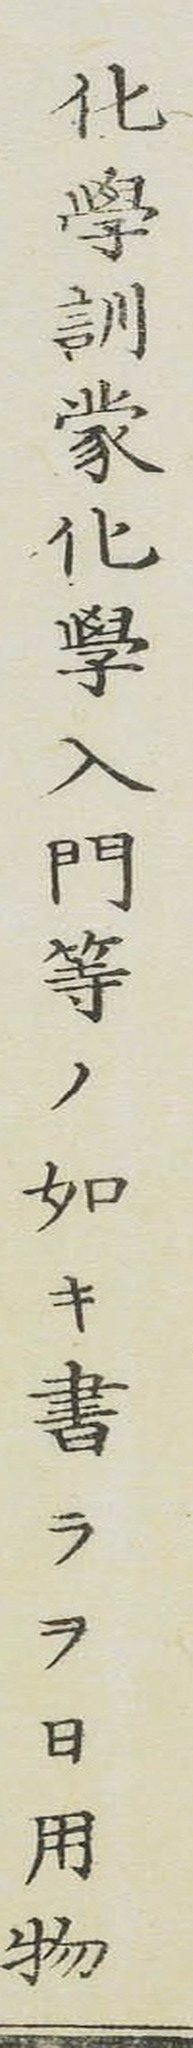化学訓蒙化学入門等ノ如キ書ラヲ日用物
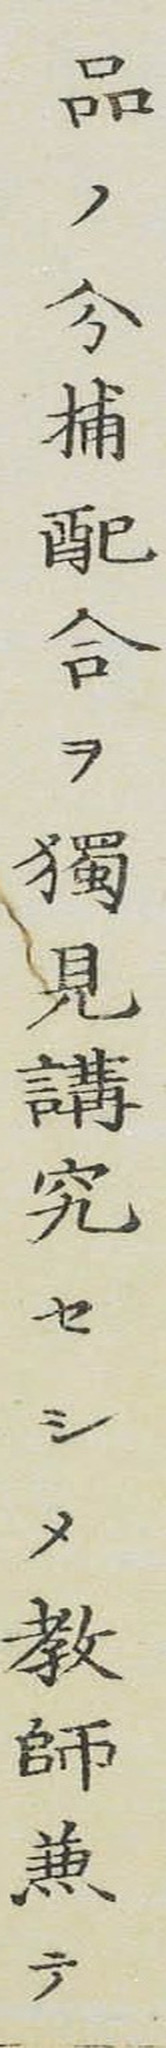品ノ分捕配合ヲ独見講究セシメ教師兼テ
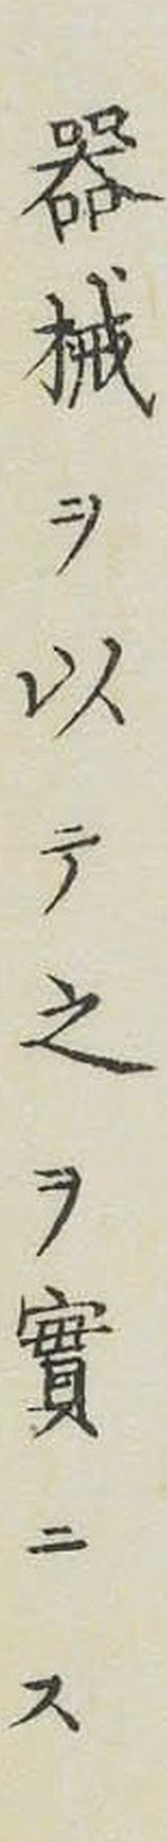器械ヲ以テ之ヲ実ニス
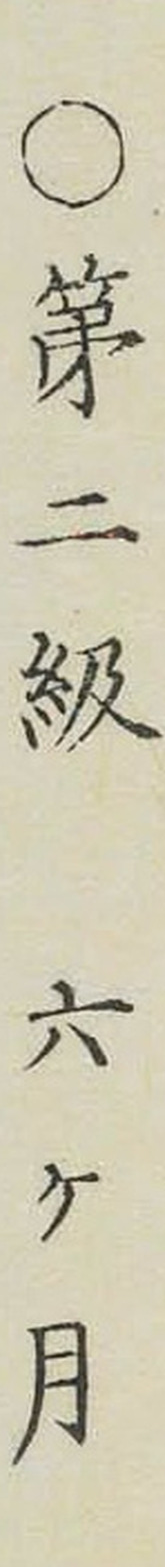○第二級六ケ月
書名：小学教則
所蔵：東京学芸大学教育コンテンツアーカイブ
